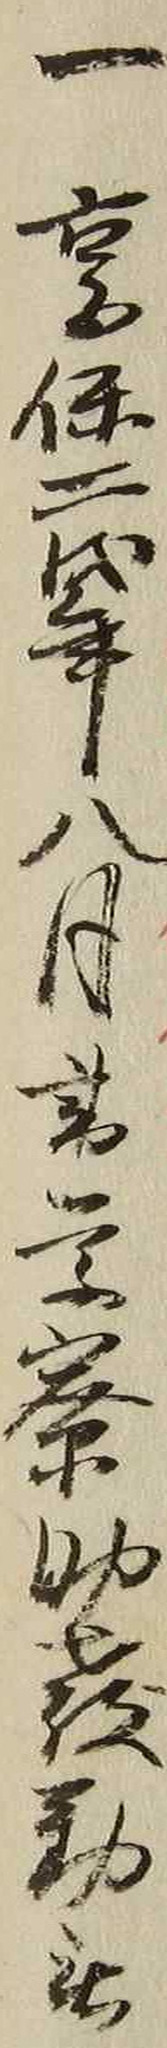一享保二戌年八月書学寮助教勤被
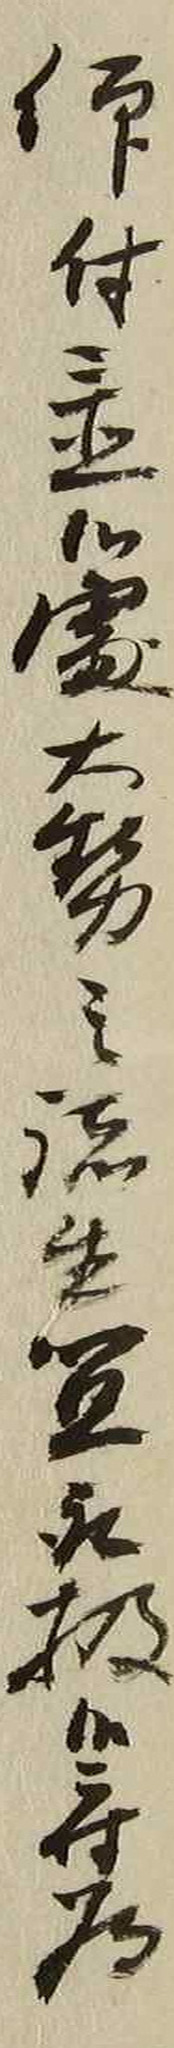仰付置候処大勢之諸生宜取扱候ニ付為
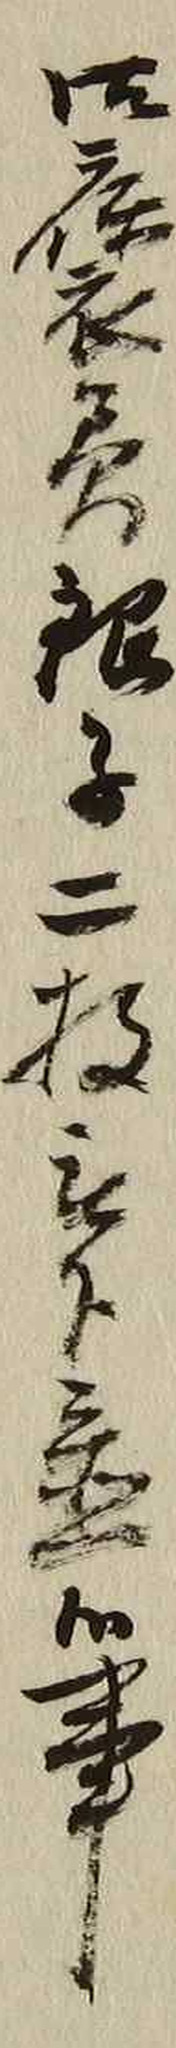御褒美銀子二枚被下置候事
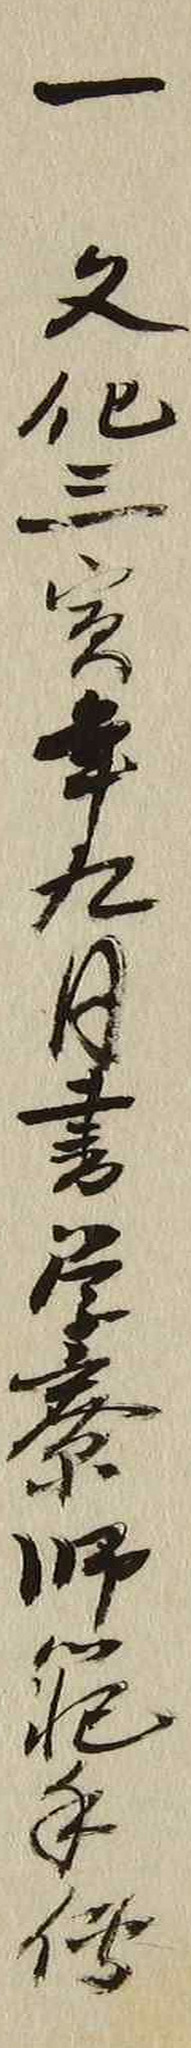一文化三寅年九月書学寮師範手伝
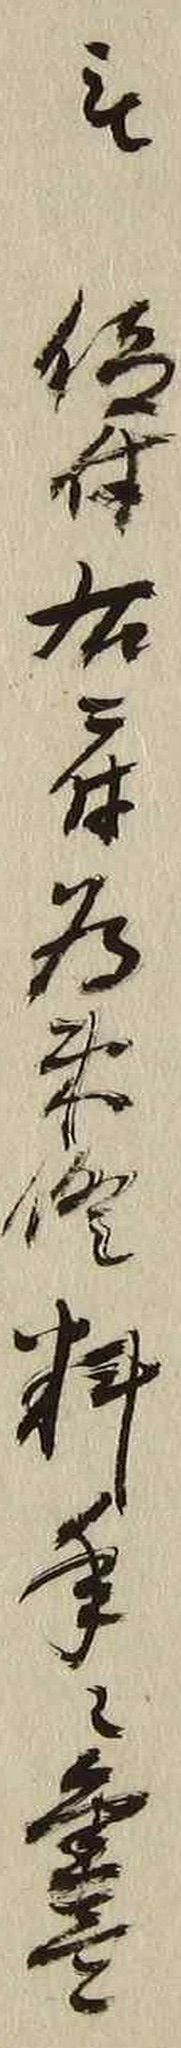被仰付右ニ付為束修料年ニ金壱
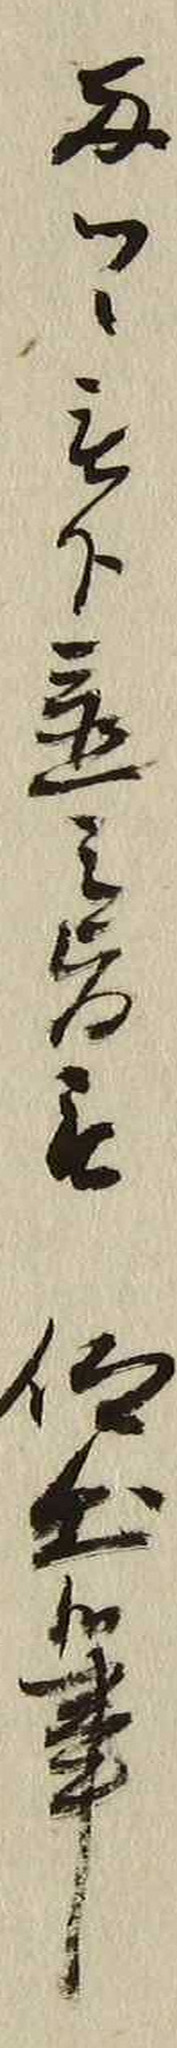両ツヽ被下置之旨被仰出候事
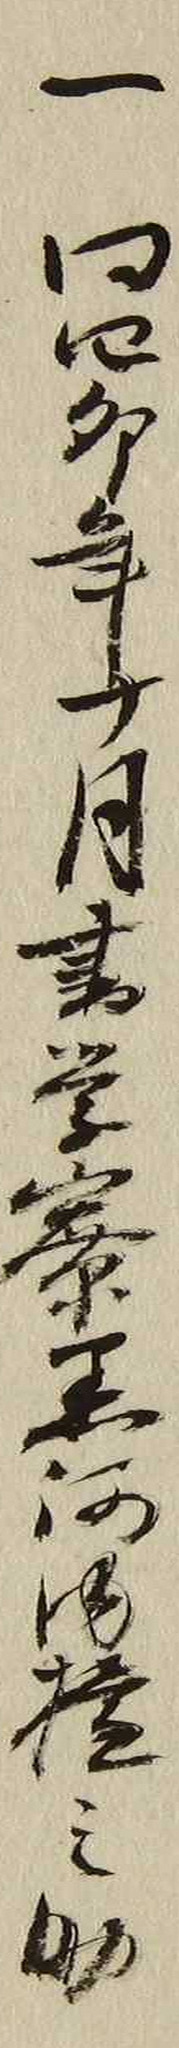一同四卯年十月書学寮黒河内権之助
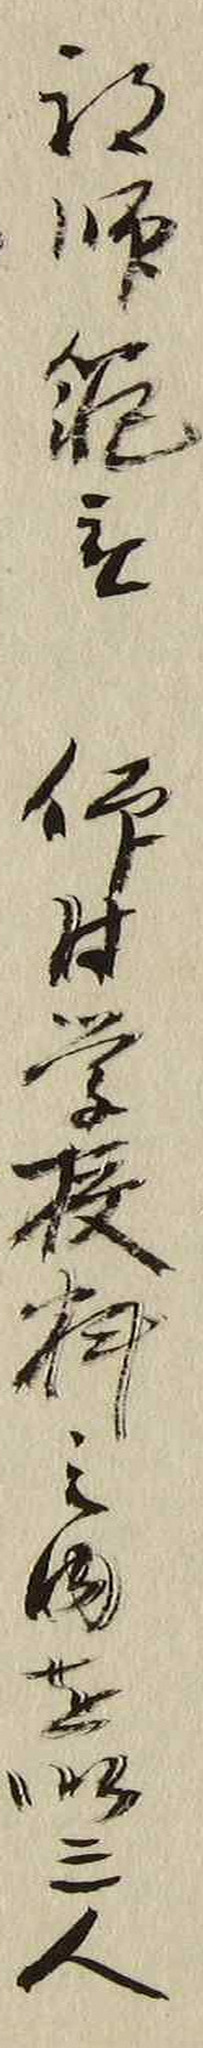跡師範被仰付学校料之内を以三人
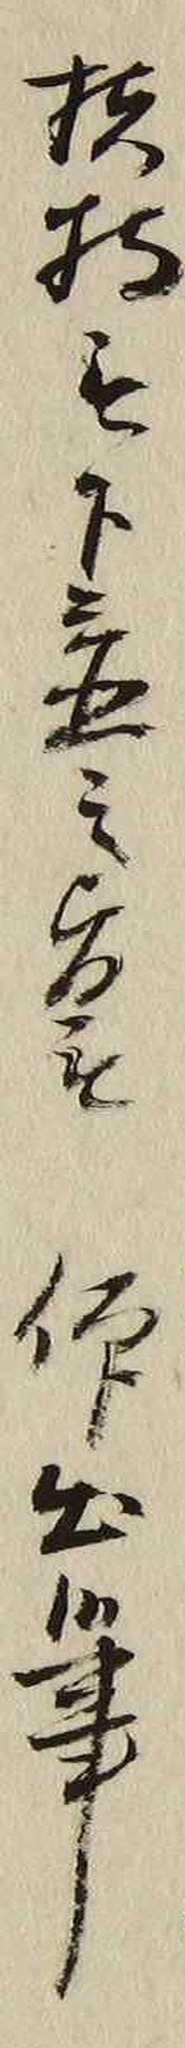扶持被下置之旨被仰出候事
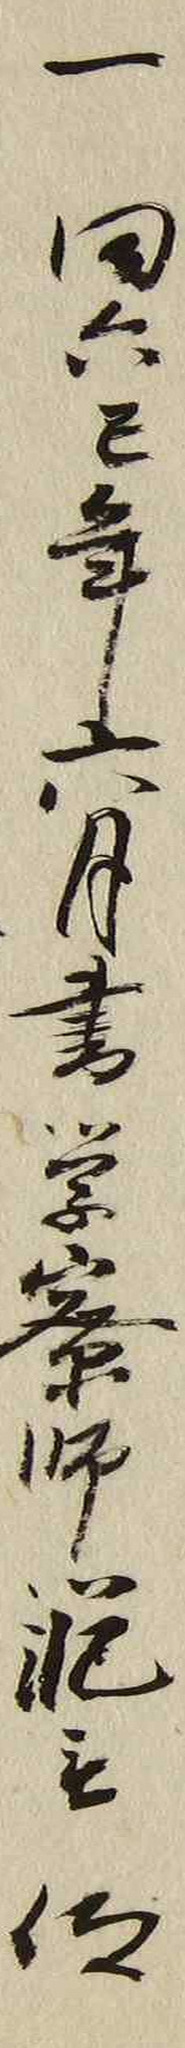一同六巳年六月書学寮師範被仰
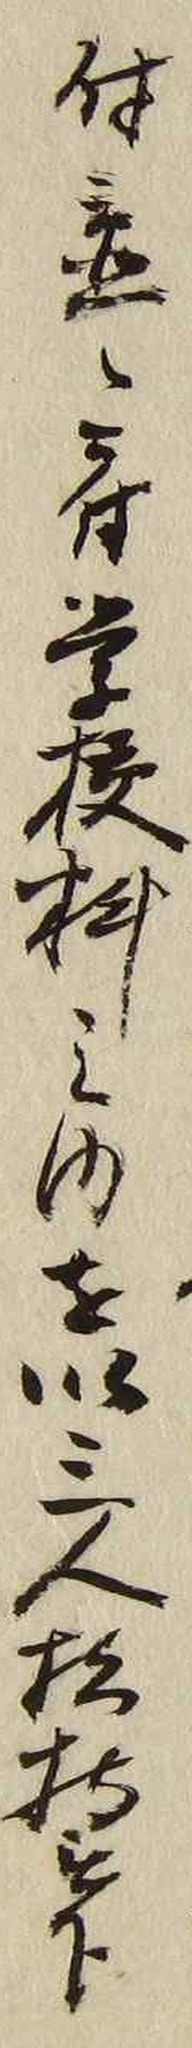付置候ニ付学校料之内を以三人扶持被下

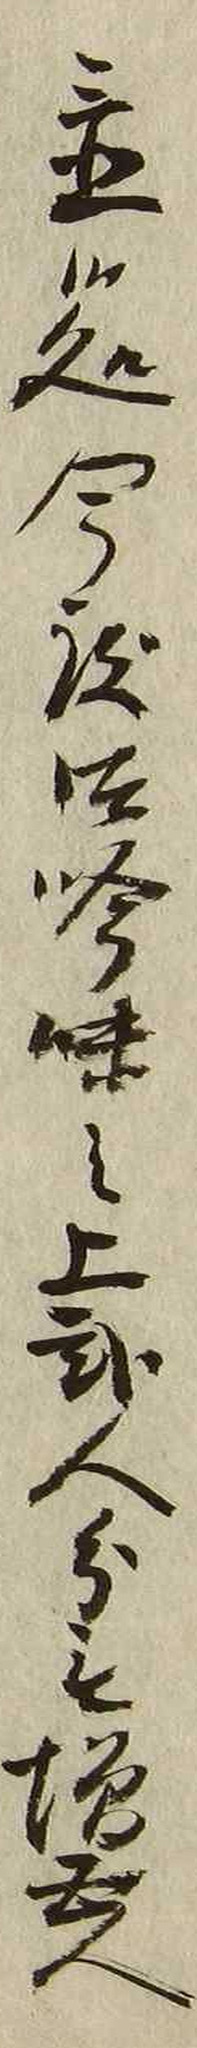置候処今度御吟味之上弐人分被増五人
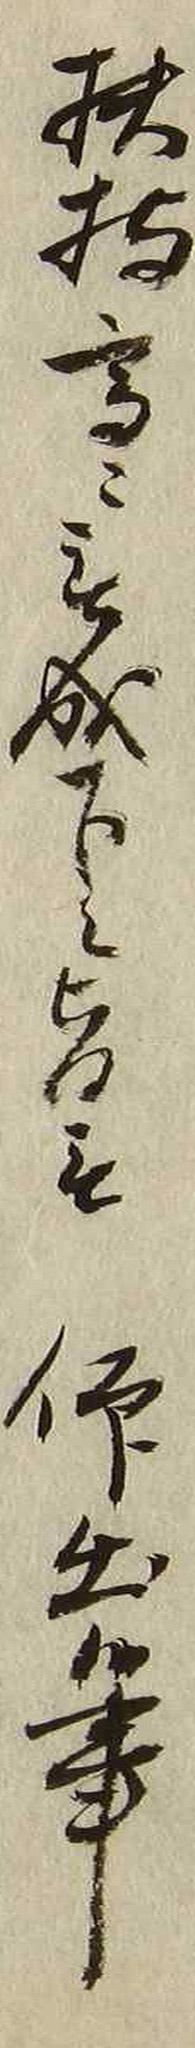扶持高ニ被成下之旨被仰出候事
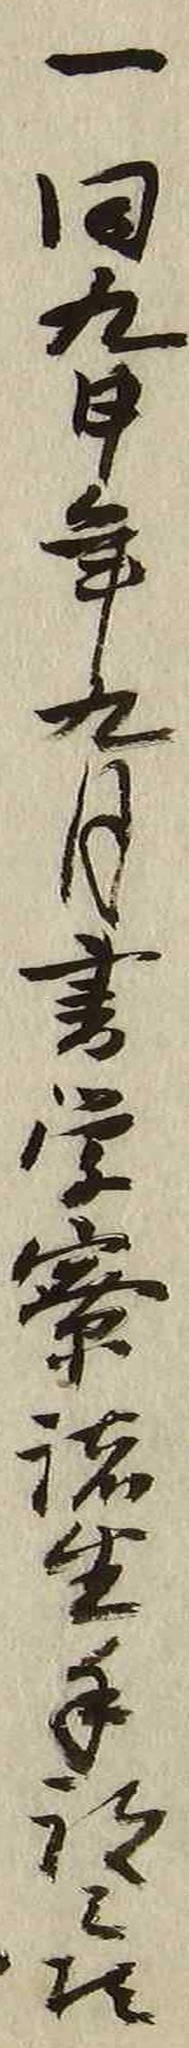一同九申年九月書学寮諸生手跡之次
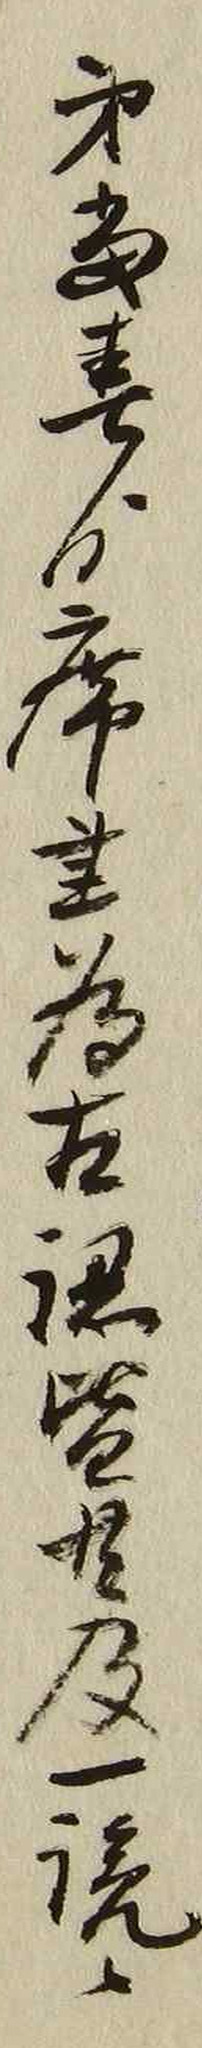第当春ゟ席書為相認皆共及一統候
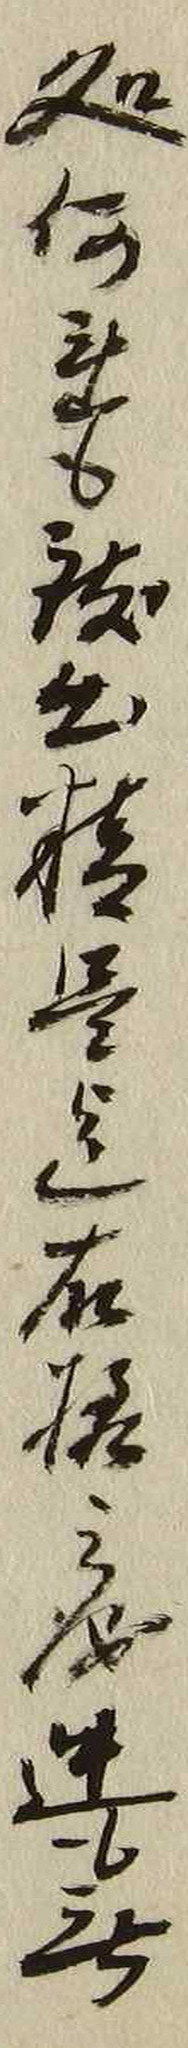処何れも致出精是迄右様之儀迚も無
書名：諸士系譜　巻之345　も之部1
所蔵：会津若松市立会津図書館
